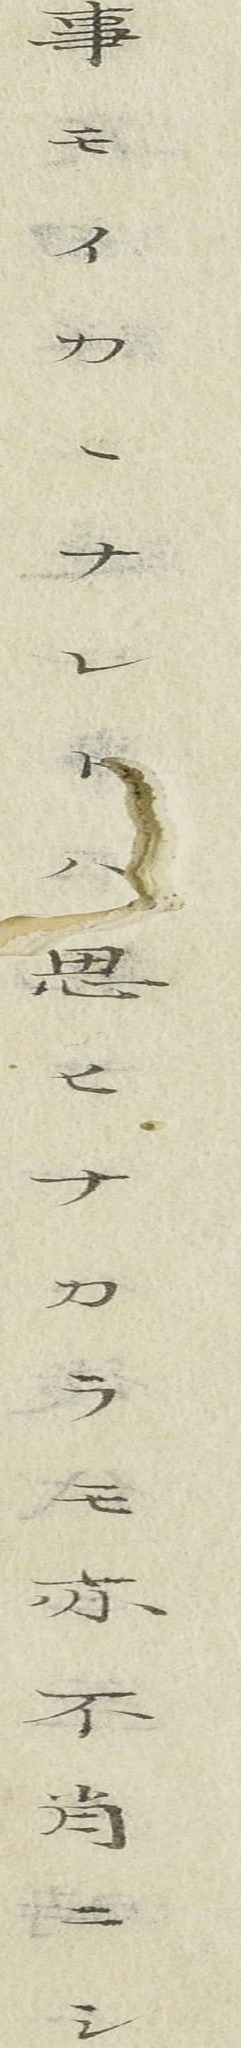事モイカヽナレトハ思ヒナカラモ亦不肖ニシ

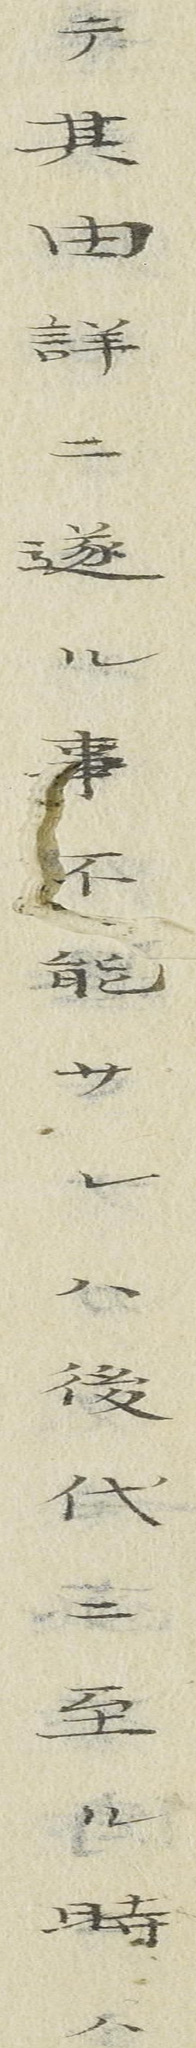テ其由詳ニ遂ル事不能サレハ後代ニ至ル時ハ
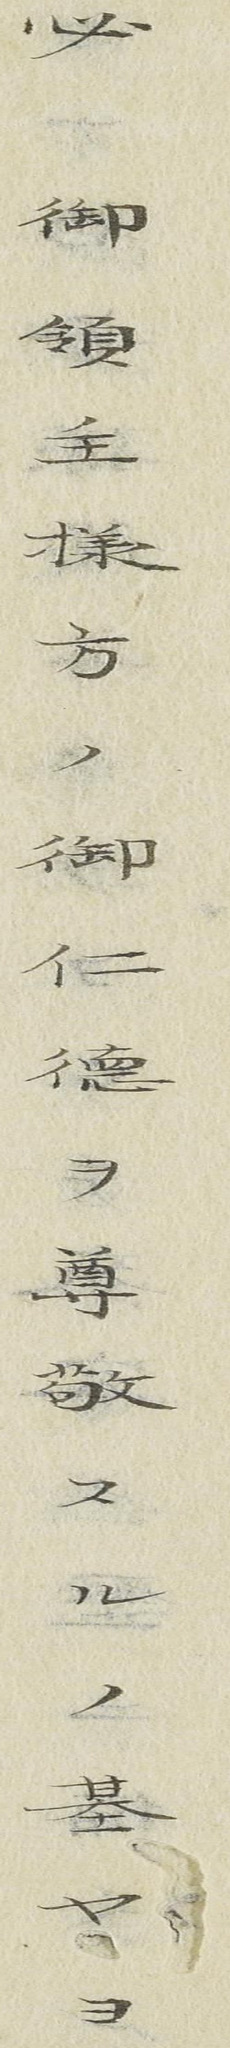必御領主様方ノ御仁徳ヲ尊敬スルノ基ヤヨ
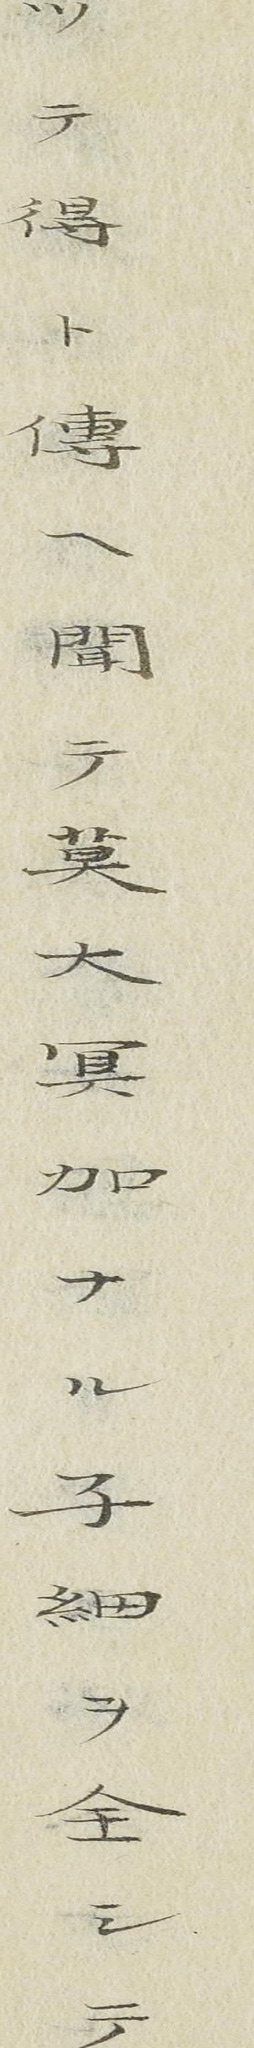ツテ得ト伝ヘ聞テ莫大冥加ナル子細ヲ全シテ
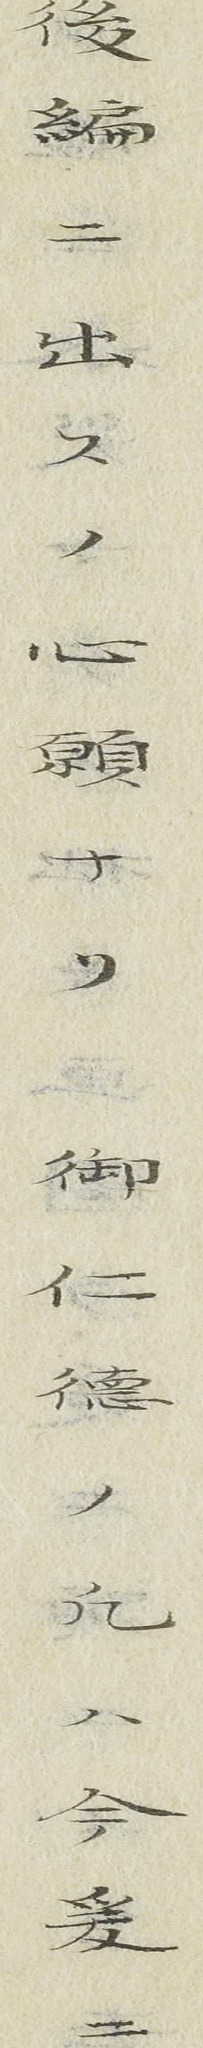後編ニ出スノ心願ナリ御仁徳ノ凡ハ今爰ニ
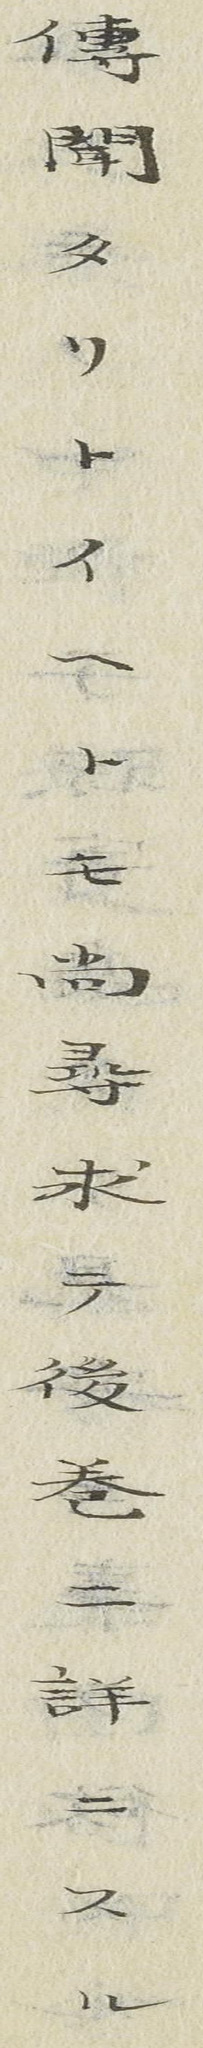伝聞タリトイヘトモ尚尋求テ後巻ニ詳ニスル
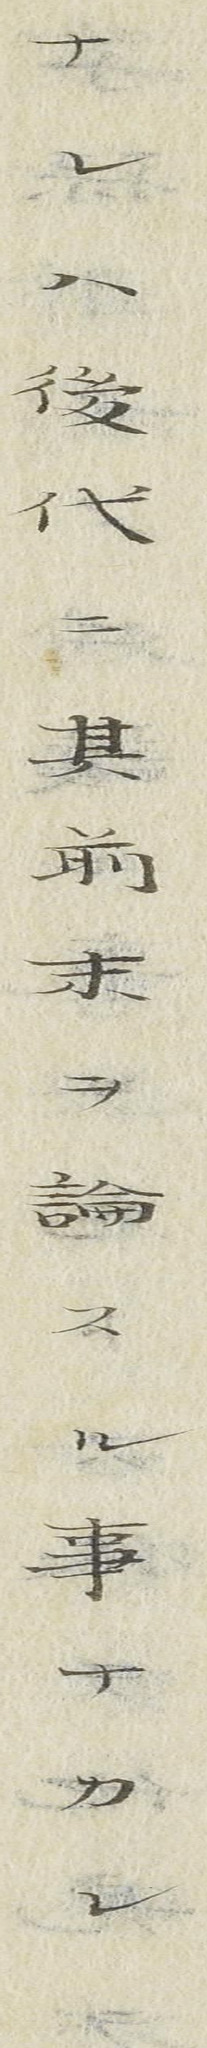ナレハ後代ニ其前末ヲ論スル事ナカレ
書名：地災撮要　地震之部　巻ノ二
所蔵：東京大学地震研究所図書室 Earthquake Research Institute Library, The University of Tokyo, JAPAN
